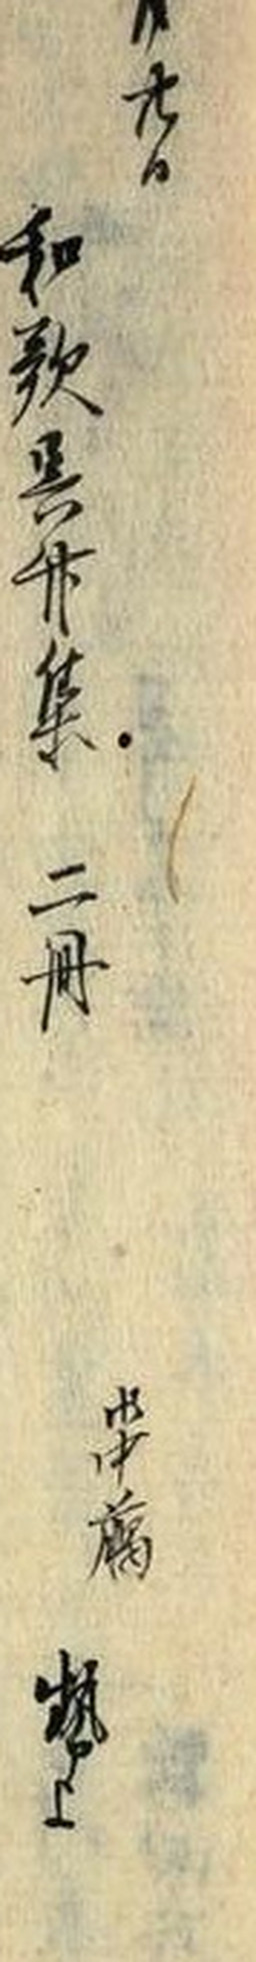和歌呉竹集二冊御中臈せよ
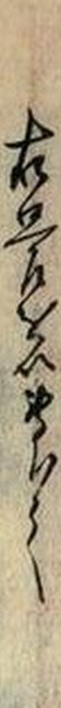右思召を以被下之
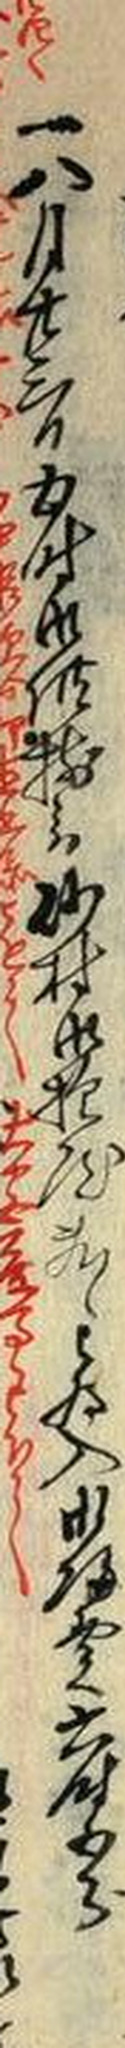一八月廿三日五時御供揃ニ而砂村御抱屋敷へ被為入御帰殿六時五分
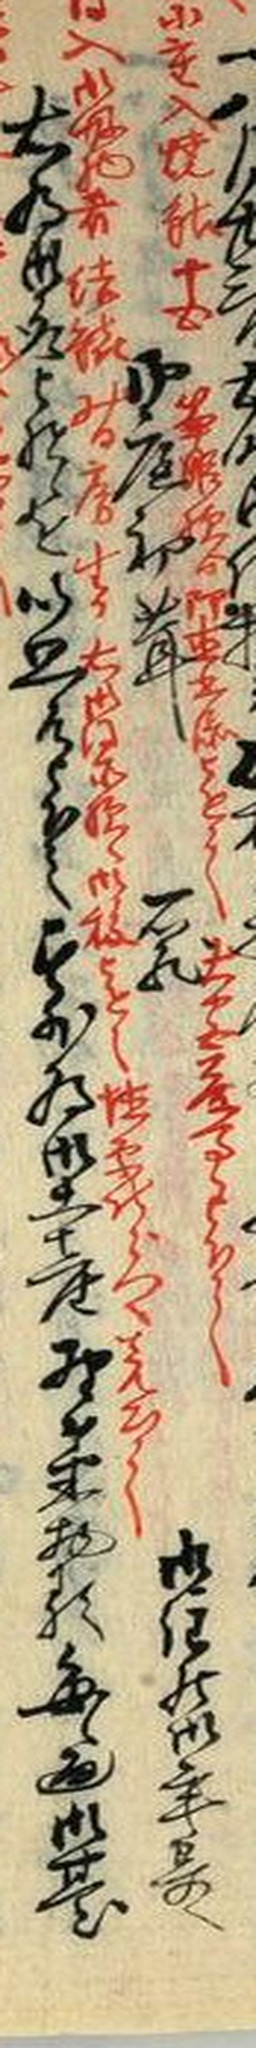右為御取被遊候を以思召被下之其外為御土産野菜物類毎之通御台
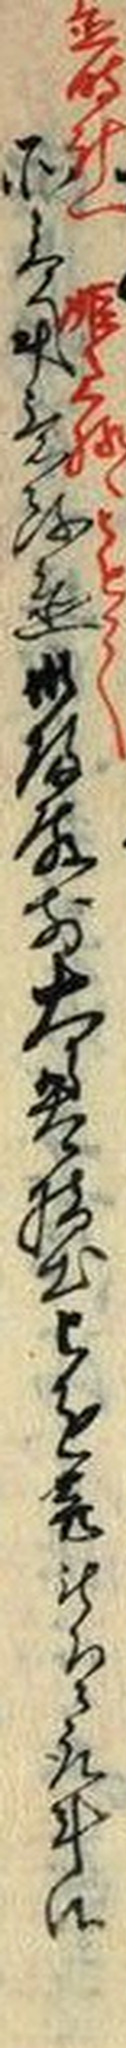所ニ而用意致置御帰殿前大奥へ指出被進并被下ニ取計候
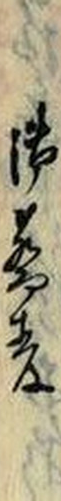御蕎麦
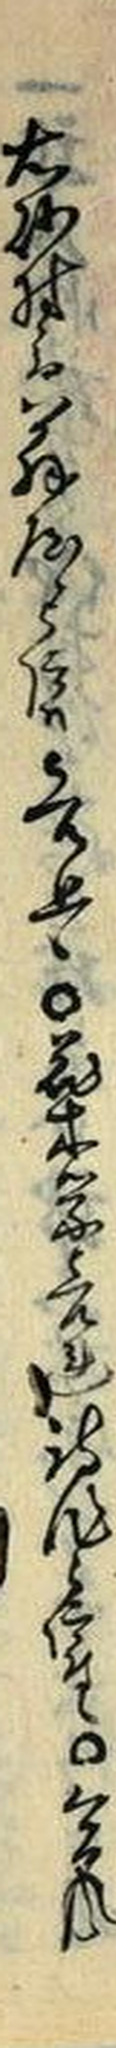右砂村ニ而扇屋へ被仰付被召上候〇花木栄被召連詩作被仰付候〇今日風
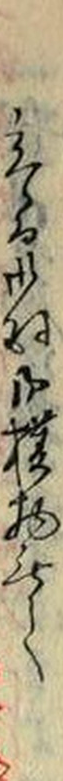立ニ而御羽御獲物無之
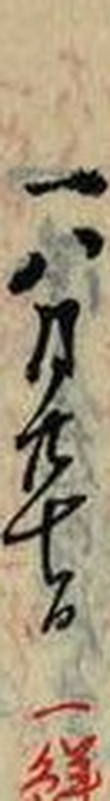一八月廿七日
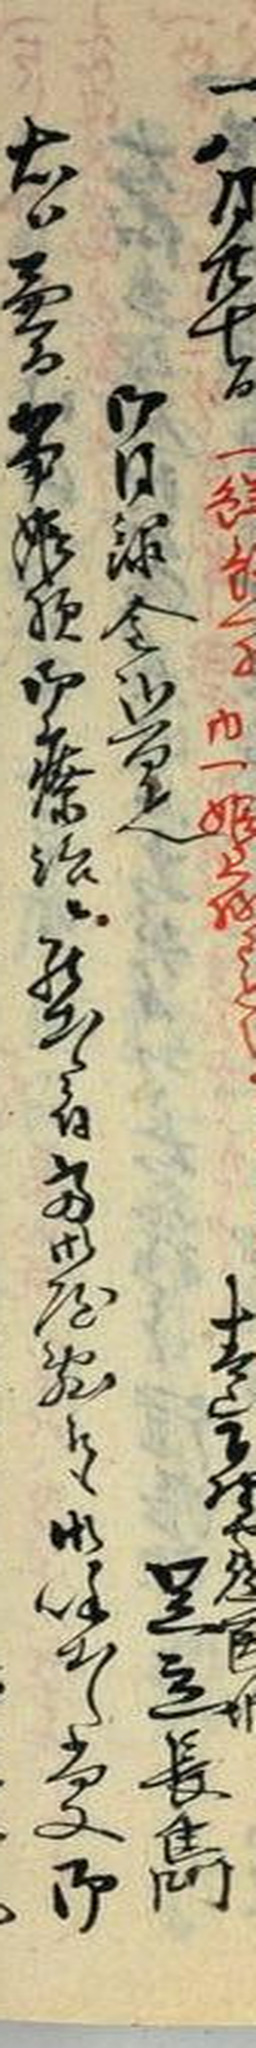右ハ兼而箏姫様御療治ニ罷出候ニ付当御屋敷江も御呼出候尚又御
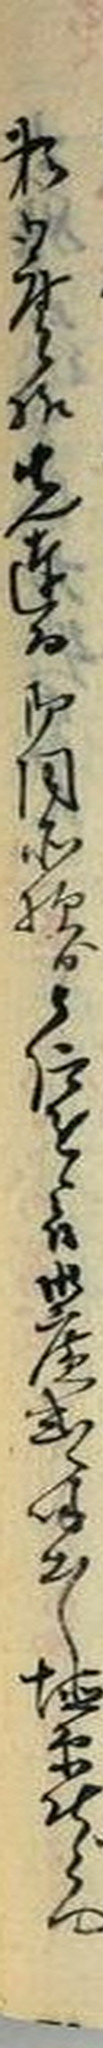頼御座候様先達而御同所様ゟ被仰進候ニ付御広式へ呼出し植原次郎右衛門
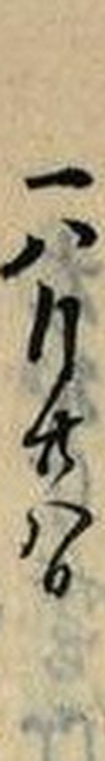一八月廿八日
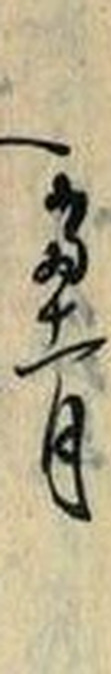当十一月
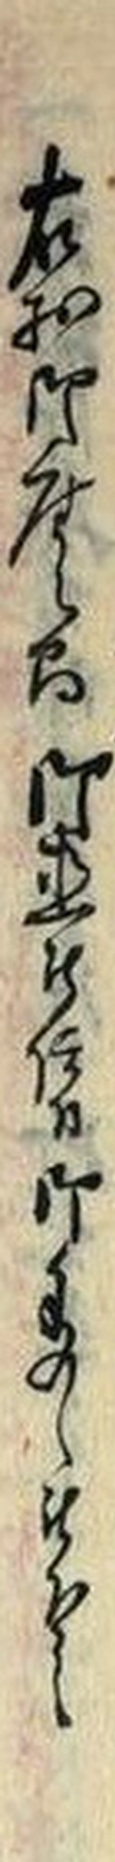右於御座之間御直被仰付御手のし被下之
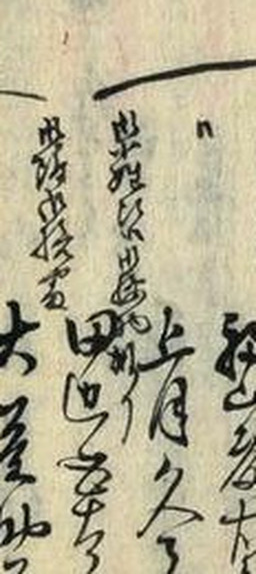御小姓頭取御腰物掛り
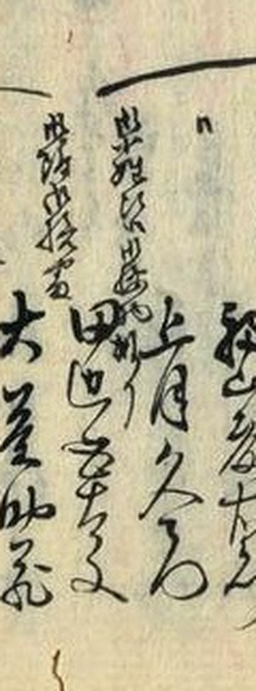御小姓頭取御腰物掛り
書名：少傅日録抄（斉承付側向頭取日記、在府）
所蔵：福井県文書館 Fukui Prefectural Archives
